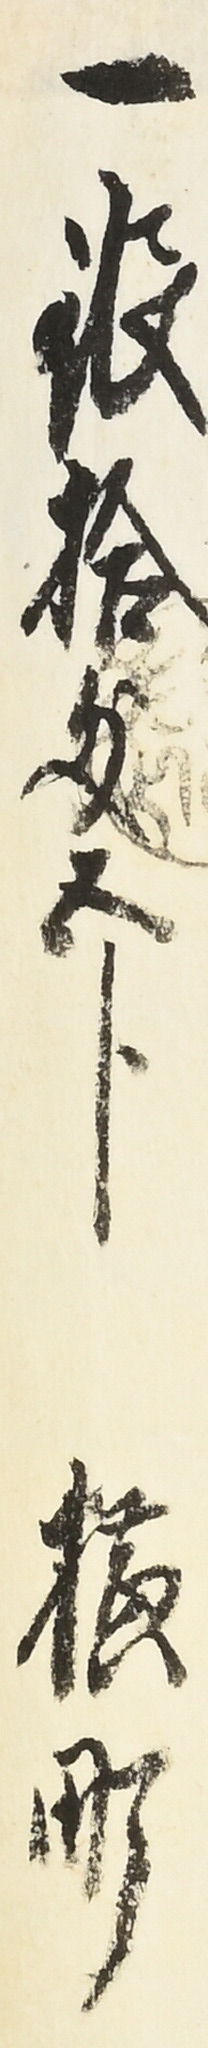一銀拾匁五分横町
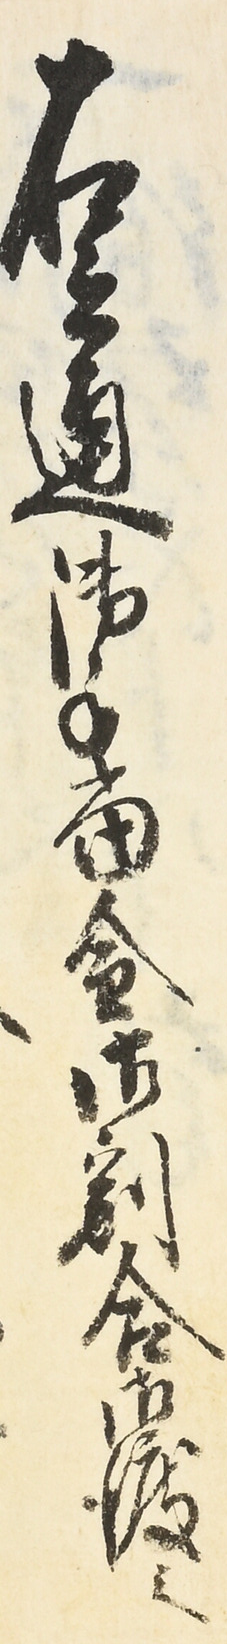右之通御手当金御割合御渡し
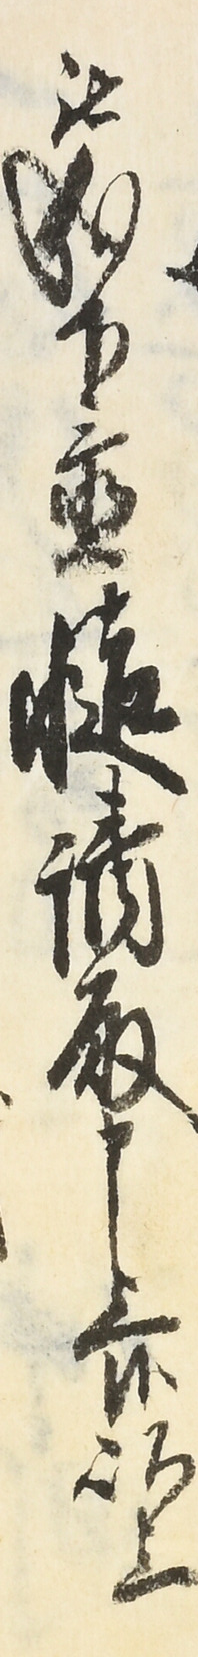被成下置慥請取申上候以上
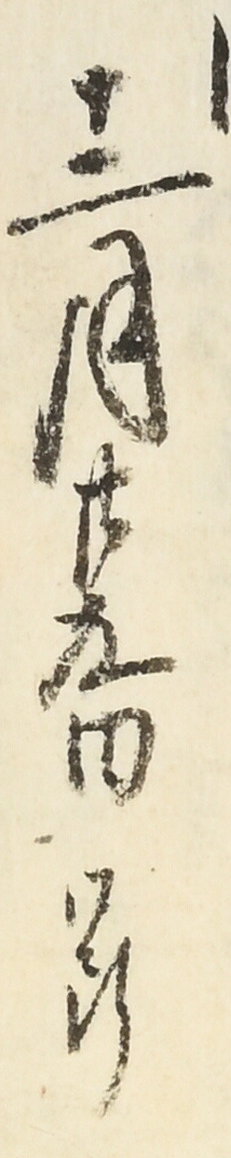十二月廿九日同断
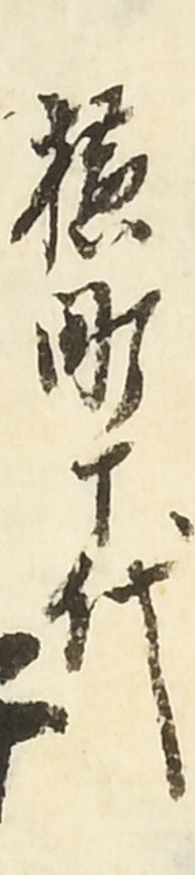新町丁代

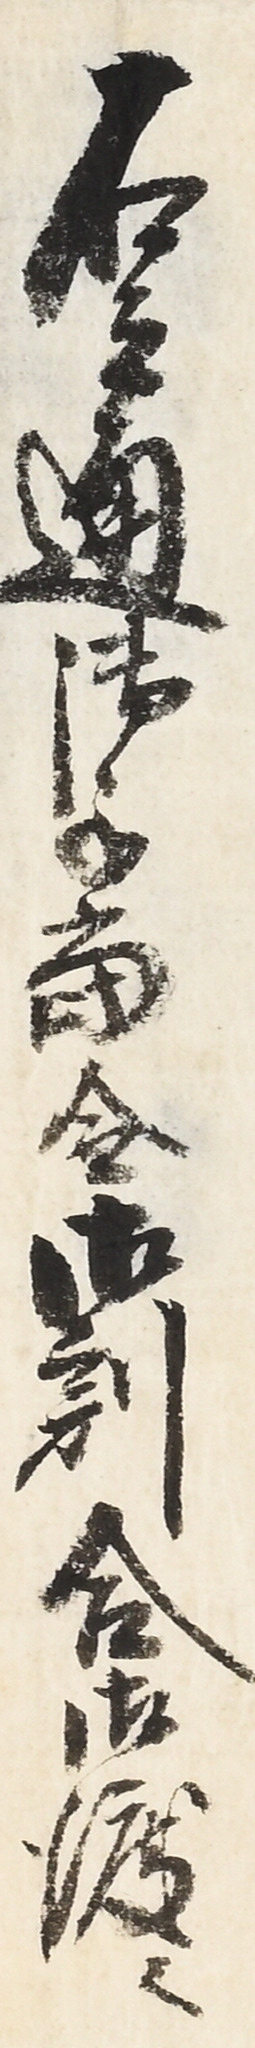右之通御手当金御割合御渡し
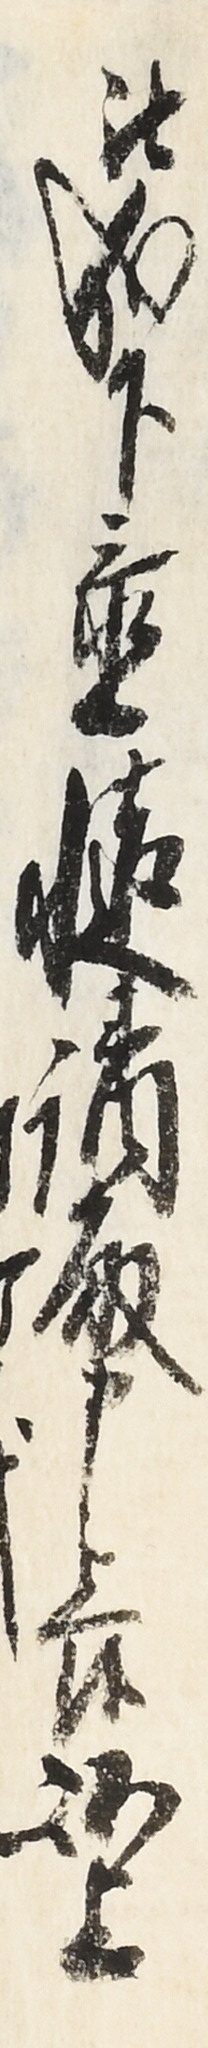被成下置慥請取申上候以上
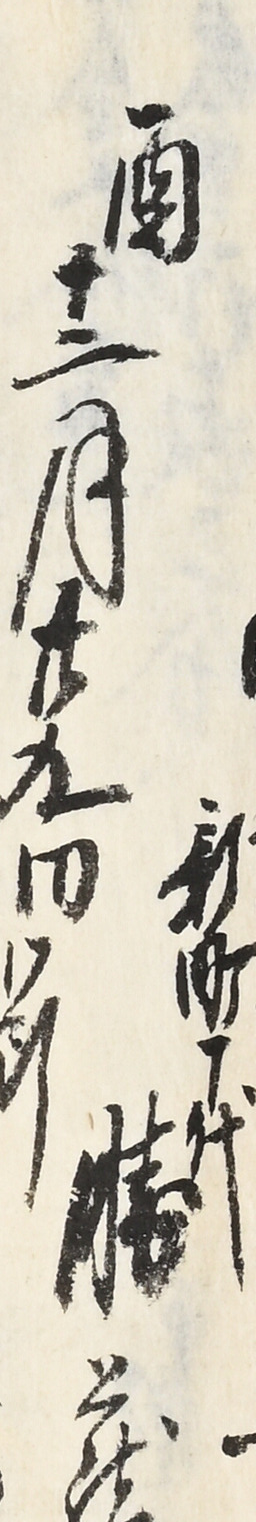十二月廿九日同断
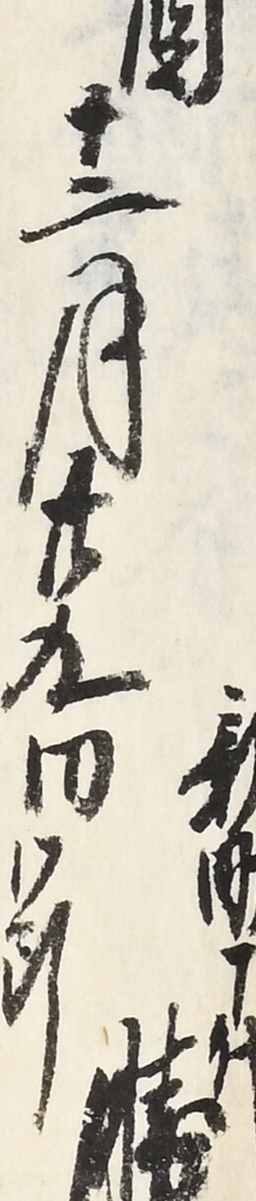十二月廿九日同断
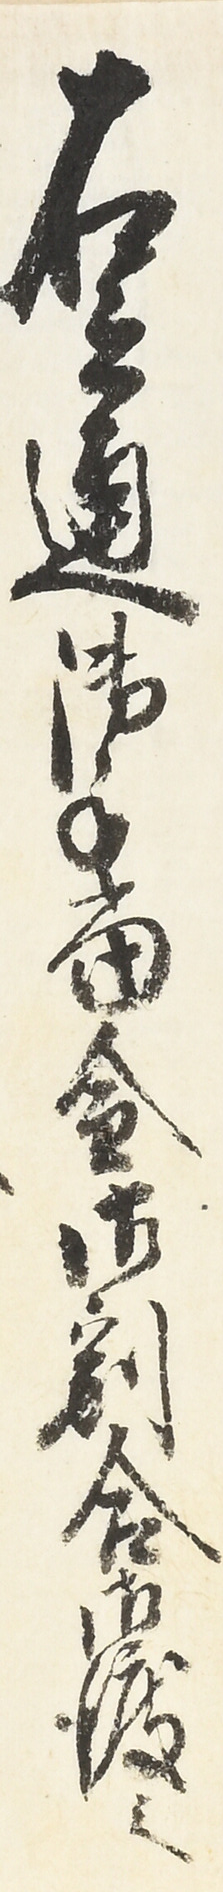右之通御手当金御割合御渡し
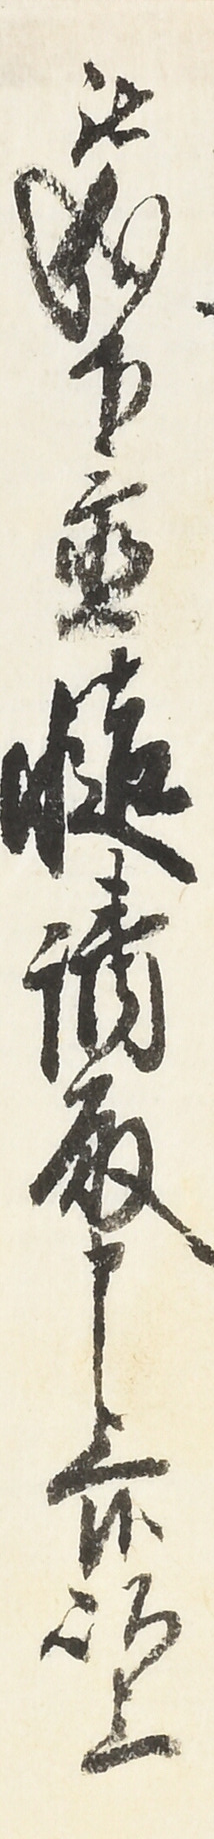被成下置慥請取申上候以上
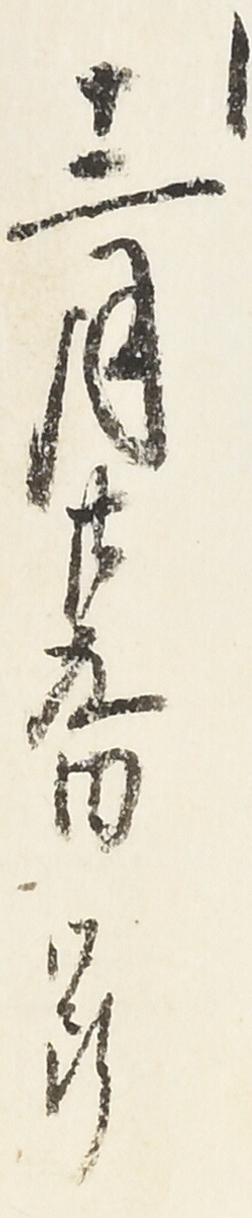十二月廿九日同断
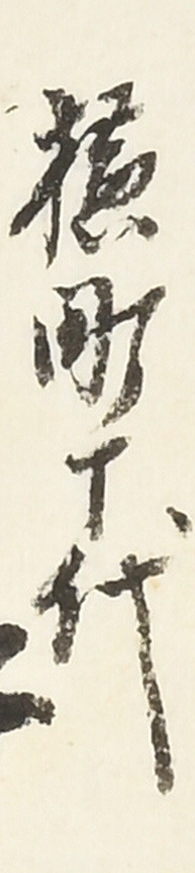横町丁代
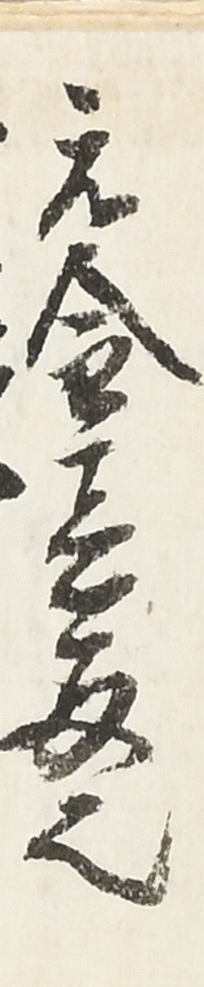元金壱両也
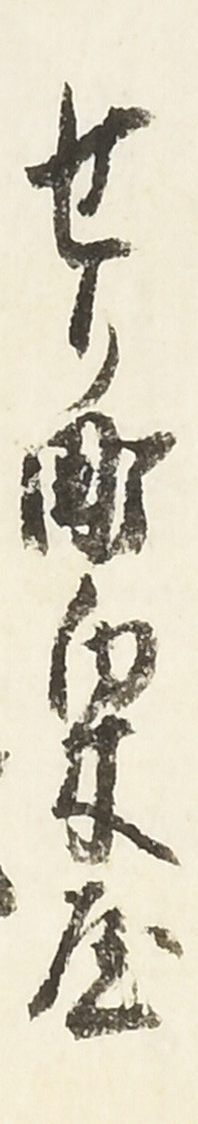せり町白木屋
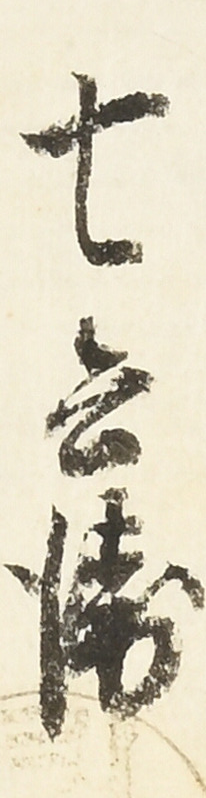七兵衛
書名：御才覚金御利足割渡扣帳
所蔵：伊那市立高遠町図書館・合同会社AMANE
